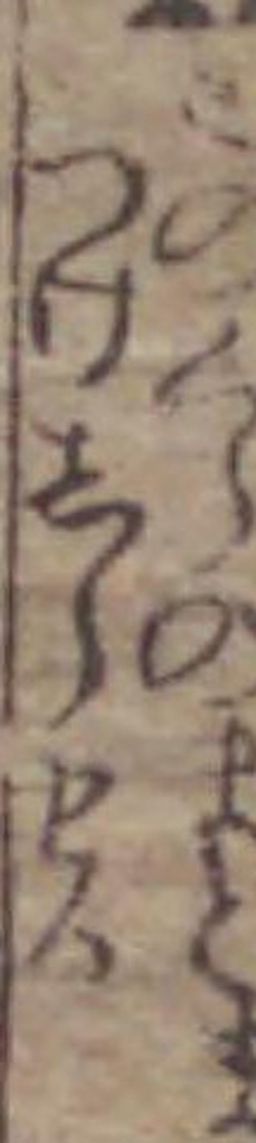つけしらせる
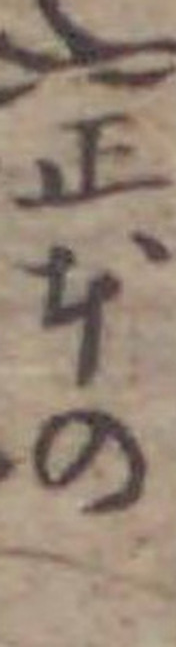正本の
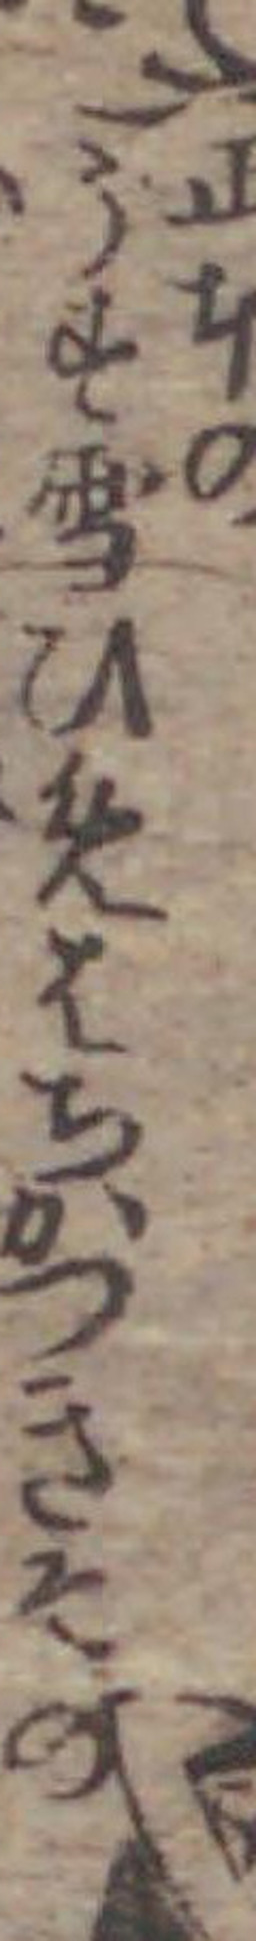うす雪ひめはちかつきその
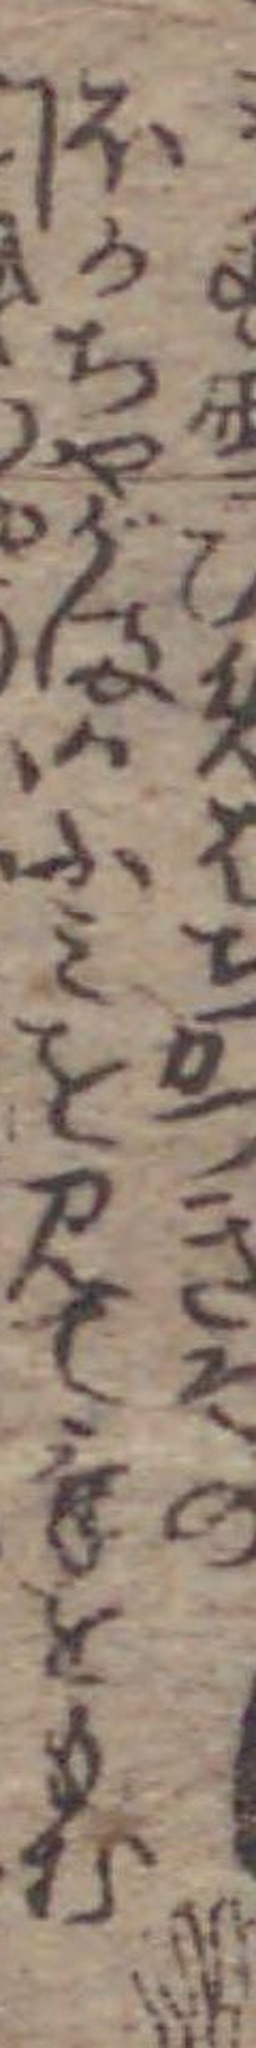ほかちやがまかふみを見て気をもむ
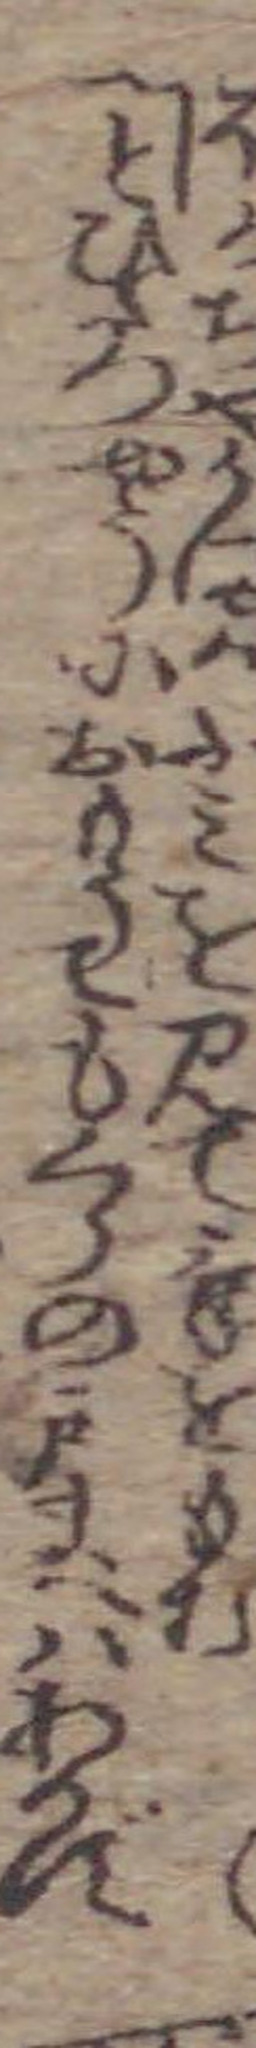〽とひたつやうにおもうてもくらの戸まへはあかず
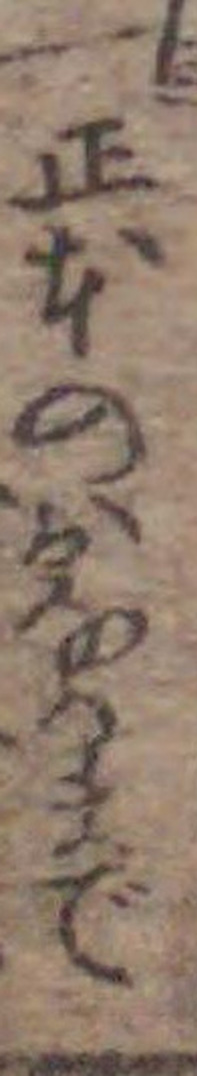正本のおなかまで
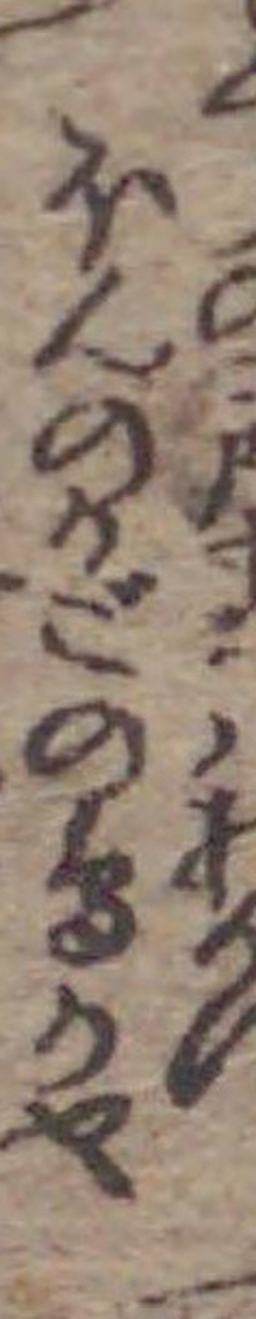ほんのかごの鳥かや
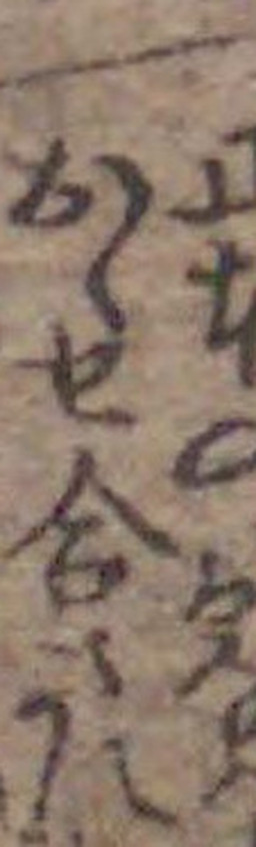おゝせ合されひ
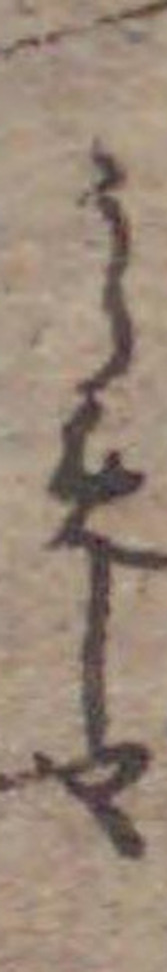うらめしや
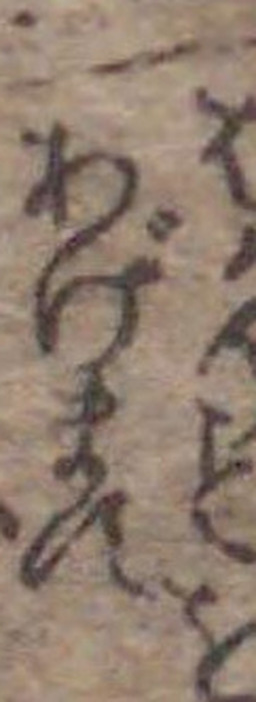あげます

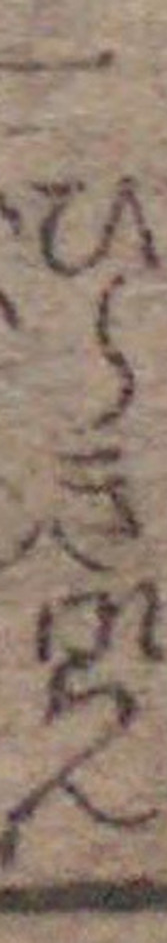びらき御らん
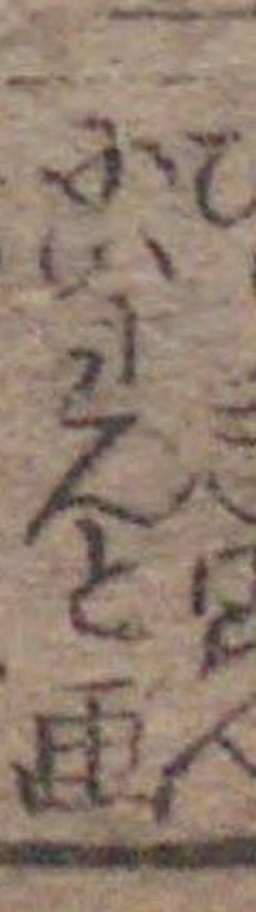にいれんと画
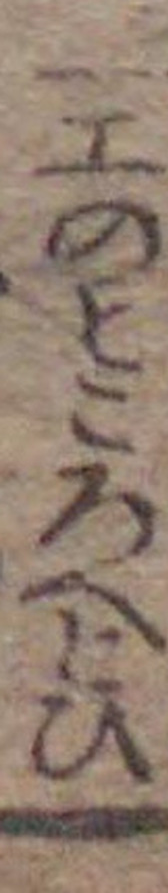工のところへとひ
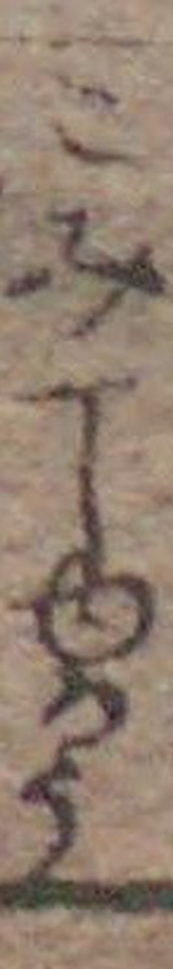こみ一しゆかう
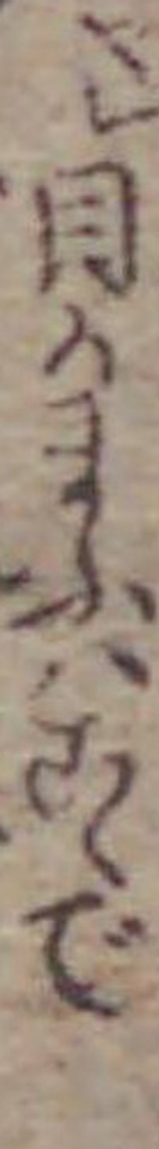ヤレ目かまふはこゝで
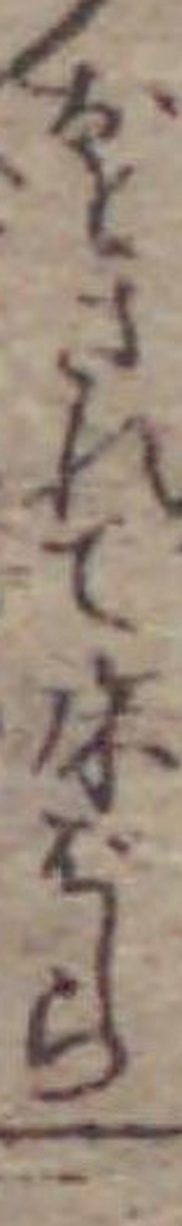おとされて床ばしら
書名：辞闘戦新根 （国会）
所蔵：国立国会図書館 National Diet Library, JAPAN
